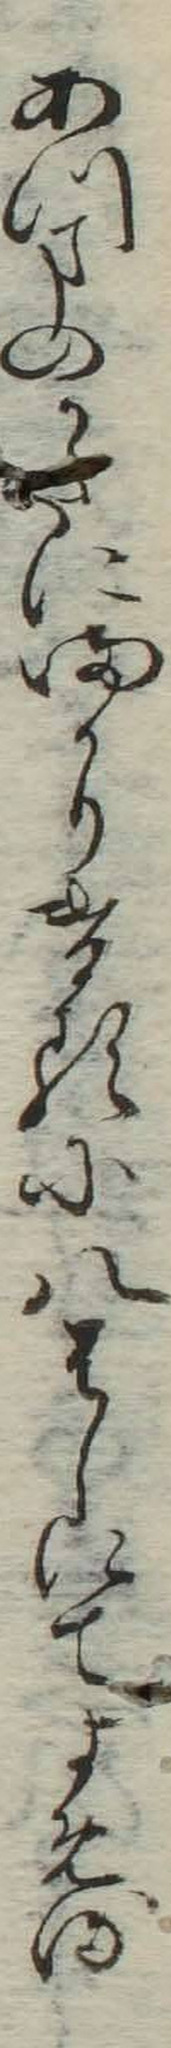あつまのかたにまかりけるに八はしにてよめる
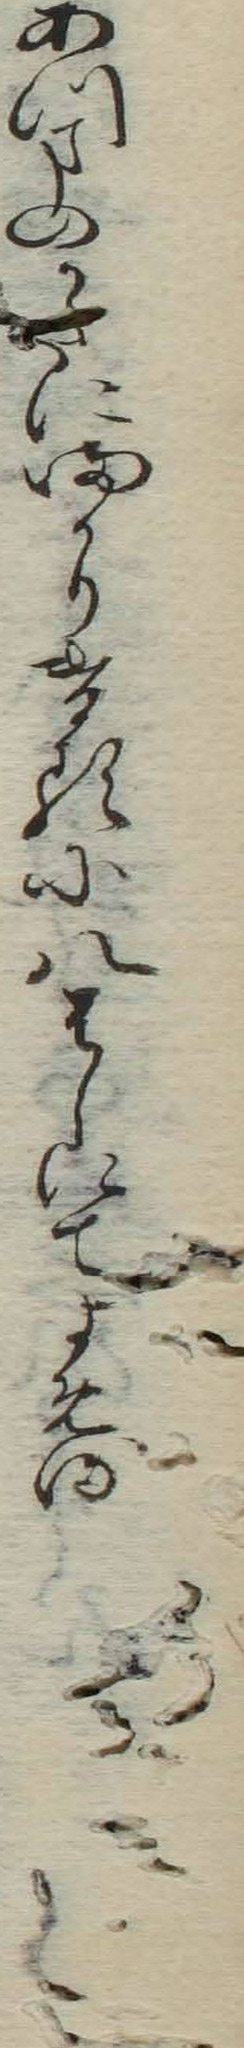あつまのかたにまかりけるに八はしにてよめる
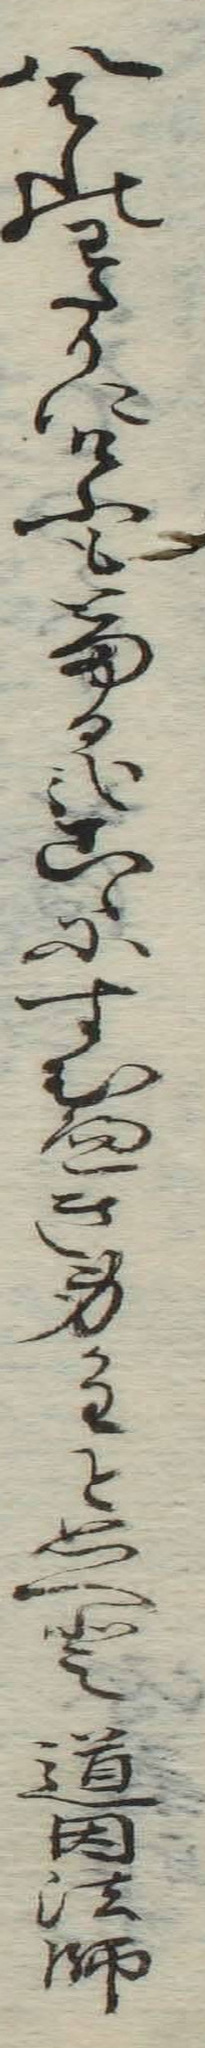千載八はしのわたりにけふもとまる哉こゝにすむへきみかわと思へと道因法師
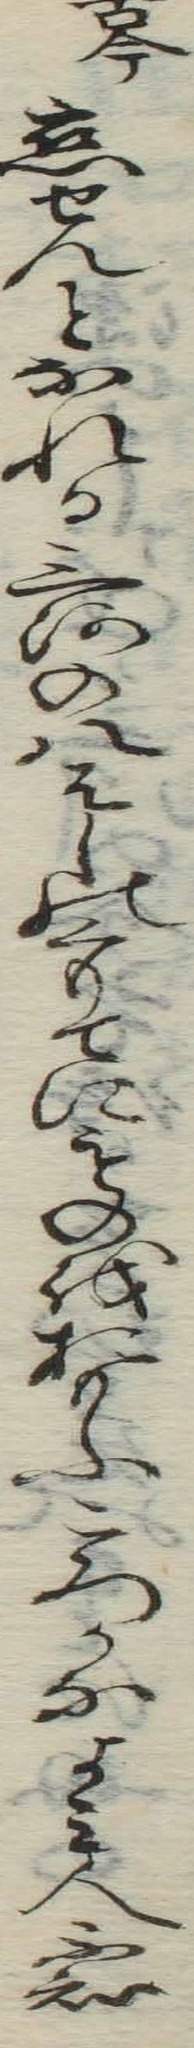続古今恋せんとなれる三河の八はしのくもてにものをおもふころかなよみ人不知
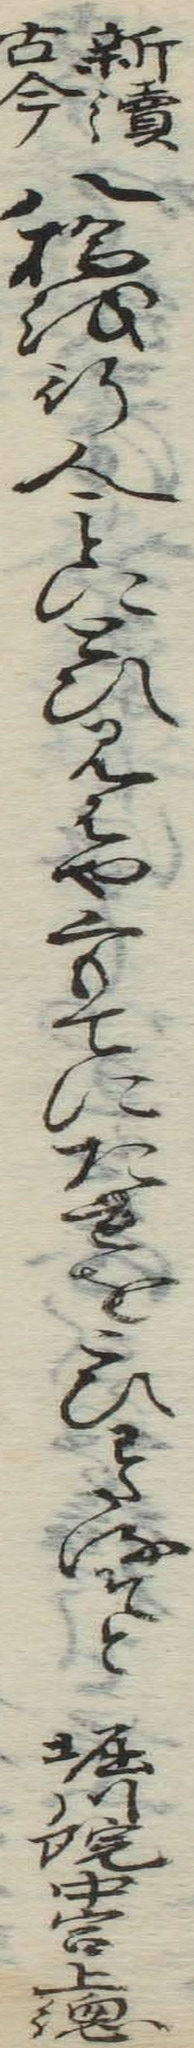新続古今八橋を行人ことにとひ見はやくもてにたれをこひわたるそと堀川院中宮上総
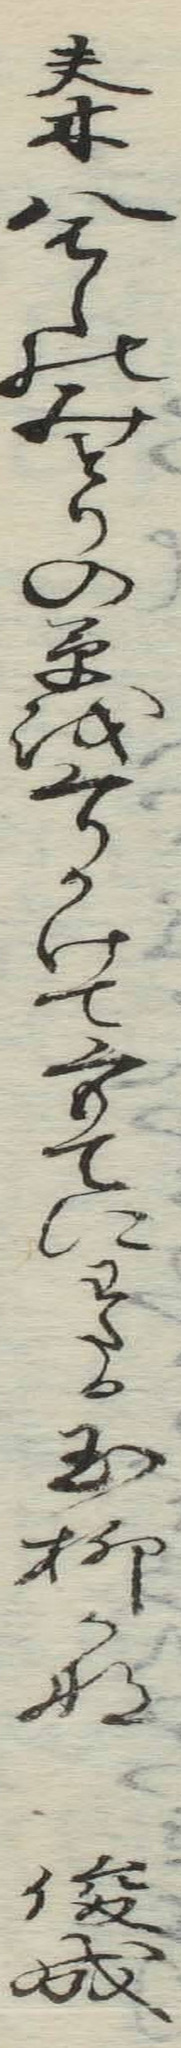夫木八はしのみとりの草をくりかけてくもてにわたる玉柳かな俊成
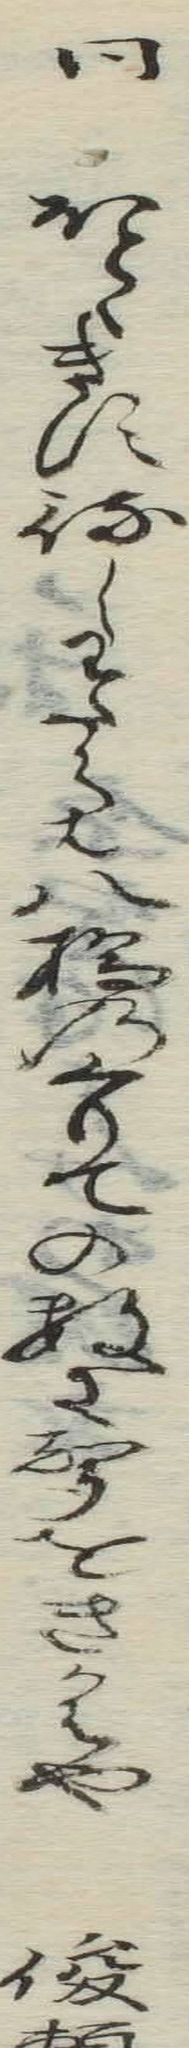同ほとゝきす待しわたらは八橋のくもての数に声をきかはや俊頼
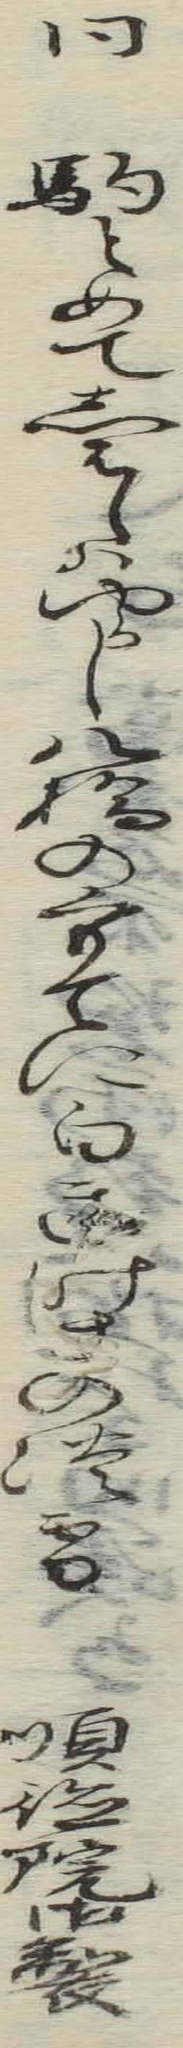同駒とめてしはしはゆかし八橋のくもてに白きけさの淡雪順徳院御製
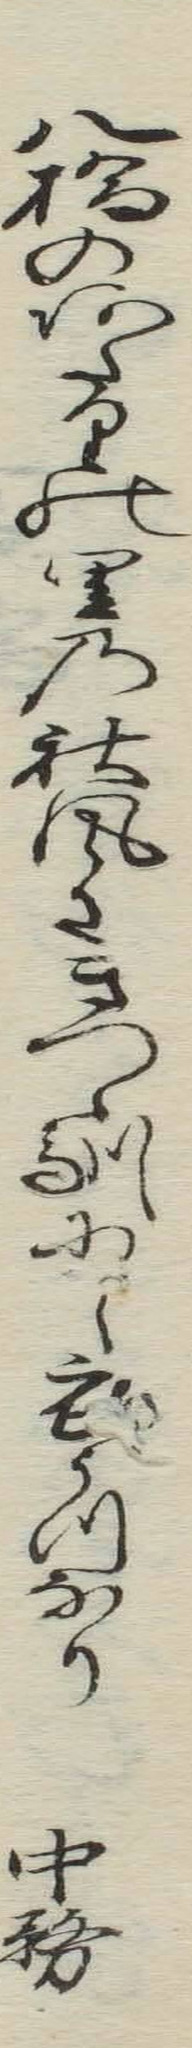同八橋のあたりの里の秋風にきつゝ馴にし衣うつなり中務
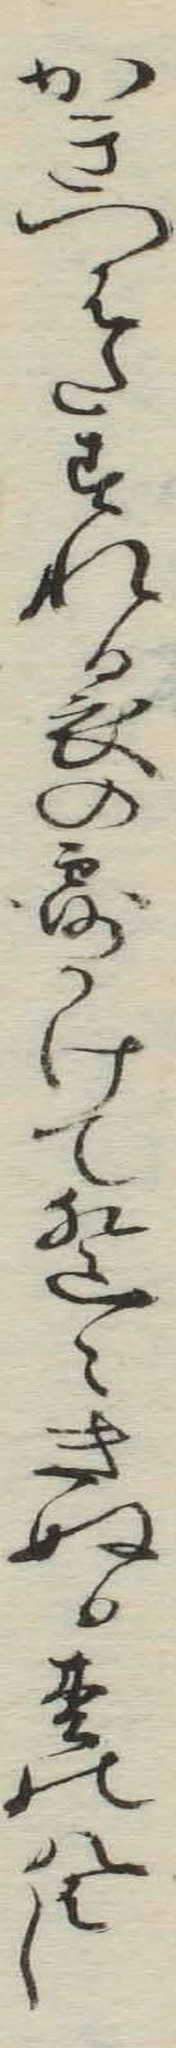かきつはたすれる衣の露かけて遥々きぬる松の八はし
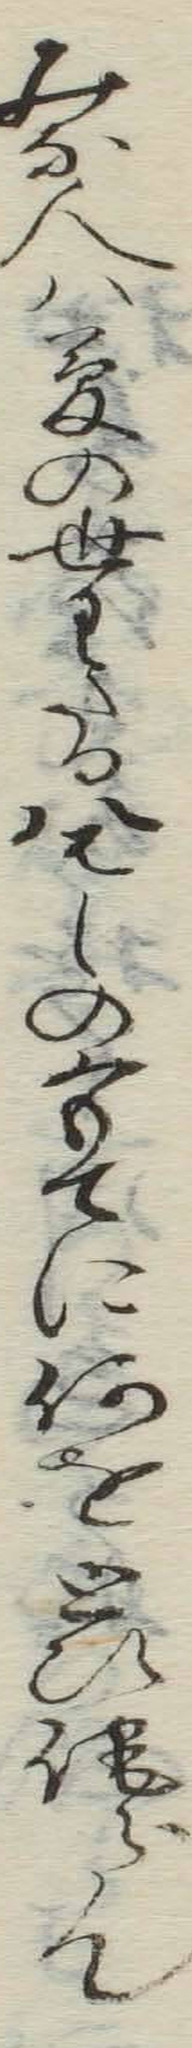みな人は夢の世わたる八はしのくもてに何をとひ侘らん
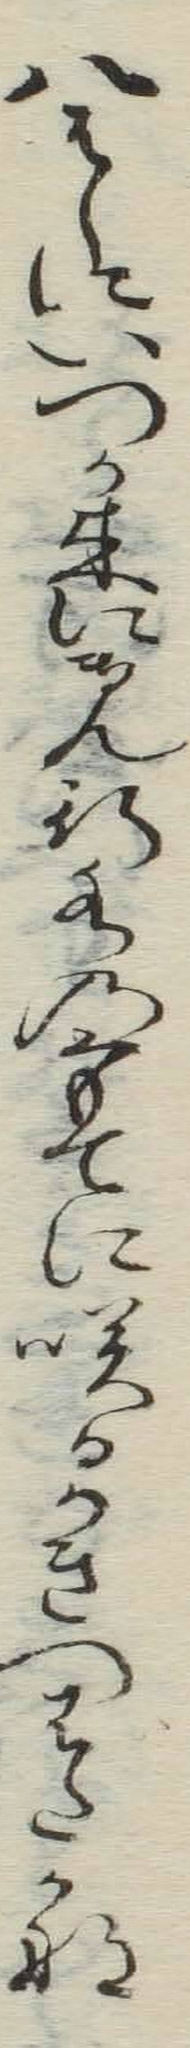八はしにいつか来にけん行水のくもてに咲るかきつはたかな
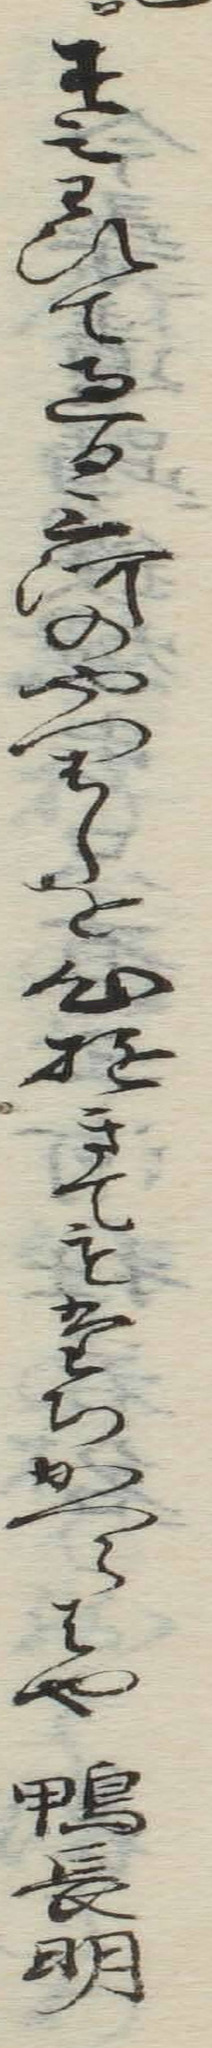海道記すみわひて過る三河のやつはしを心ゆきてもたちかへらはや鴨長明
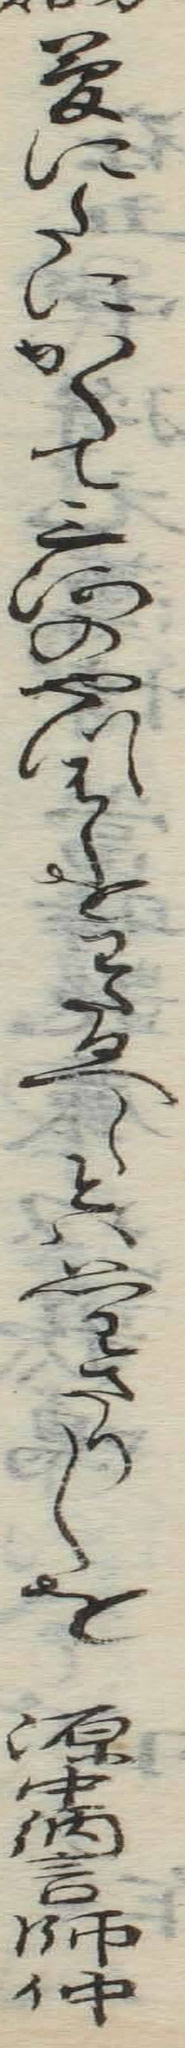平家物語夢にたにかくて三河のやつはしをわたるへしとは思わさりしを源中納言師仲
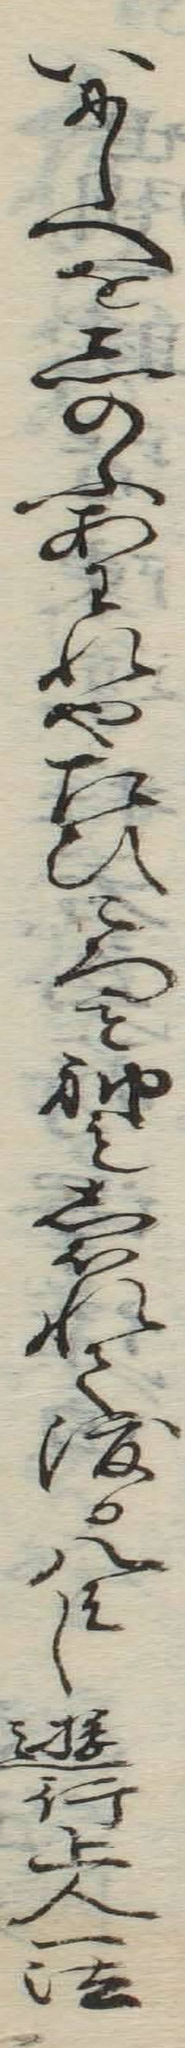いにしへをしのふあわれやたひころも袖もしほれて渡る八はし遊行上人一法
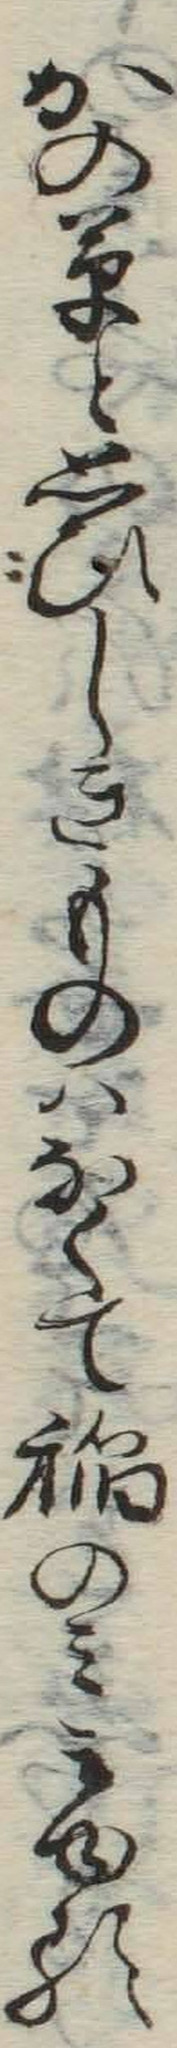かの草と思ひしきものはなくて稲のみみゆる
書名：三河国二葉松
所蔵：国文学研究資料館
